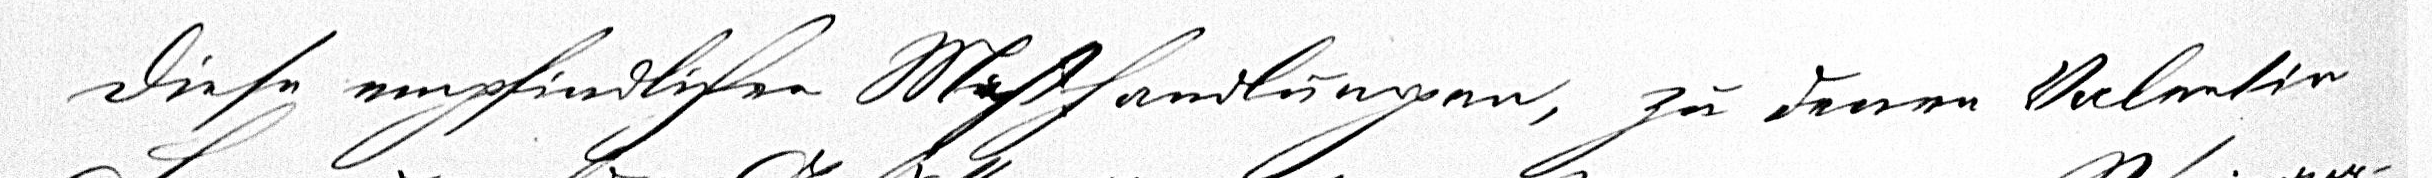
Diese empfindlichen Maßhandlungen, zu denen Valentin
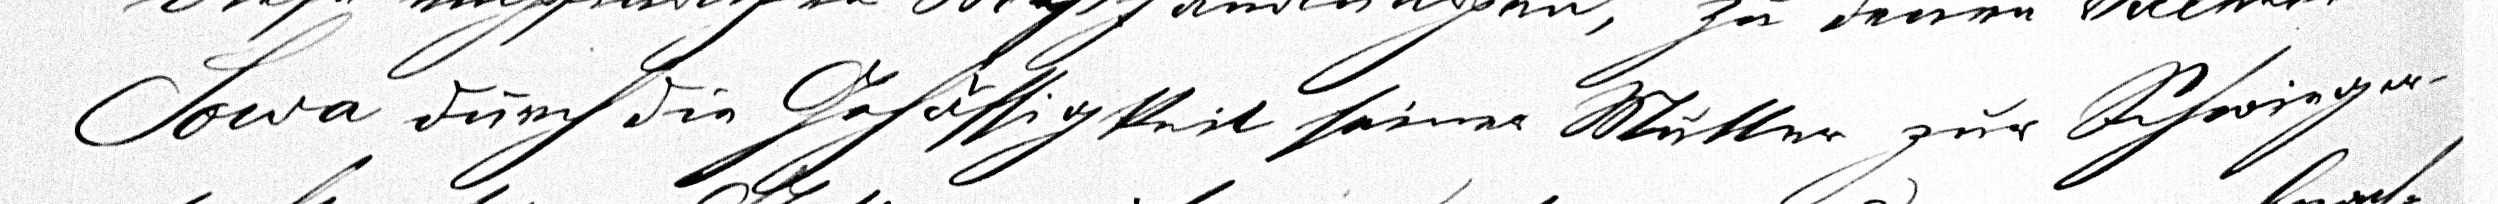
Sowa durch die Gefässigkeit seiner Mutter zur Schwieger¬
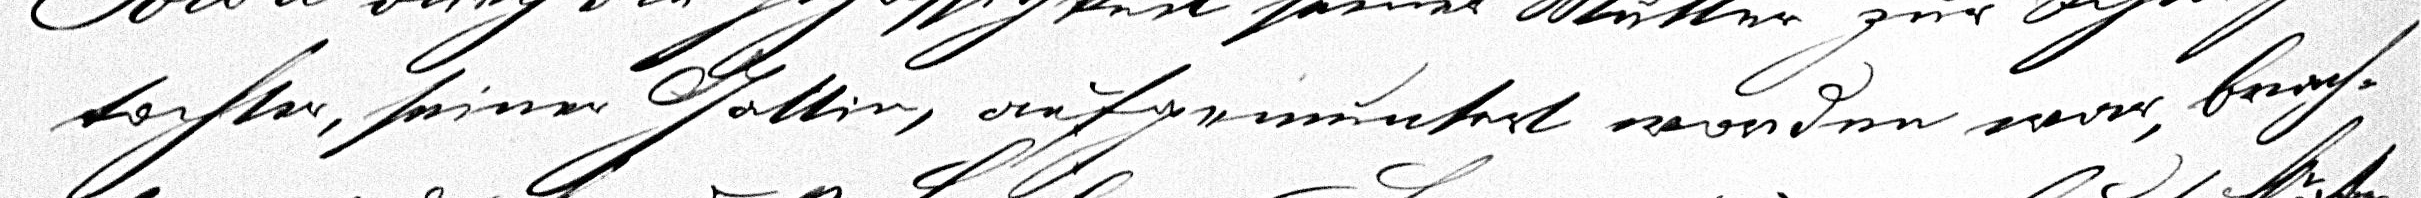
tochter, seiner Gattin, aufgemuntert worden war, brach¬
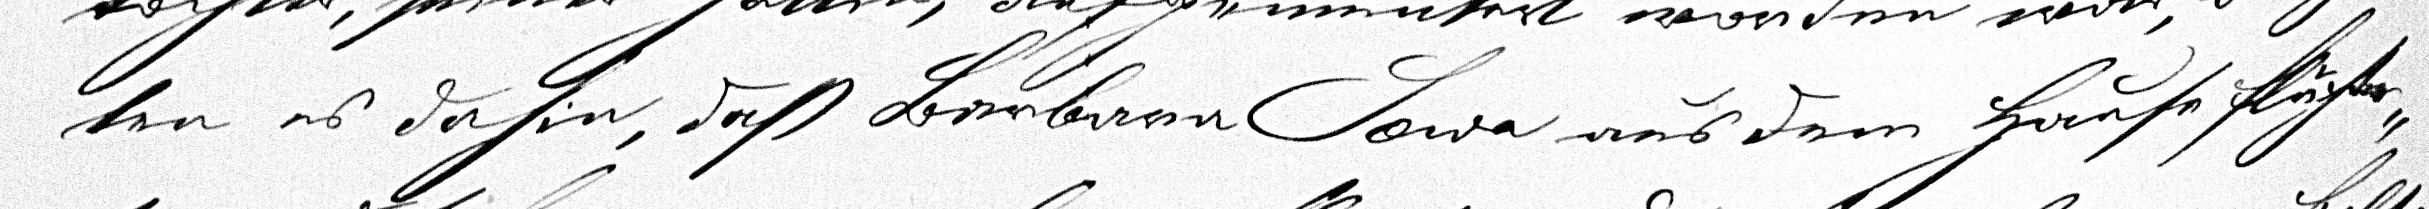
ten es dahin, daß Barbara Sowa aus dem Hause Führ¬
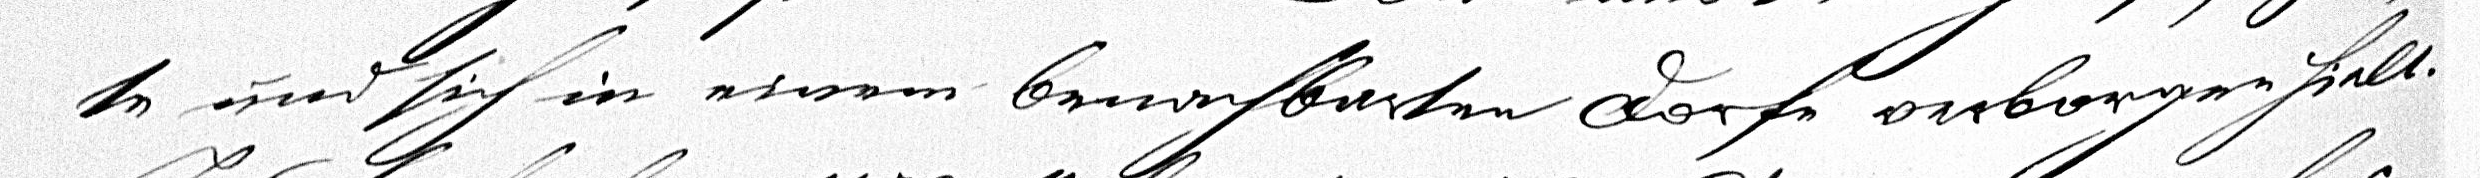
ten und sich in einem benachbarten Dorf verborgen hielt.
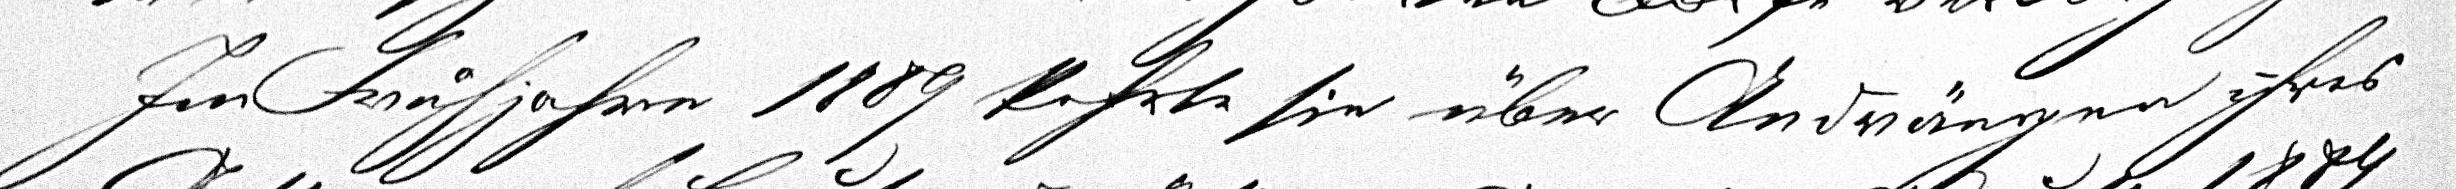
Im Frühjahre 1889 kehrte sie über Andrängen ihres
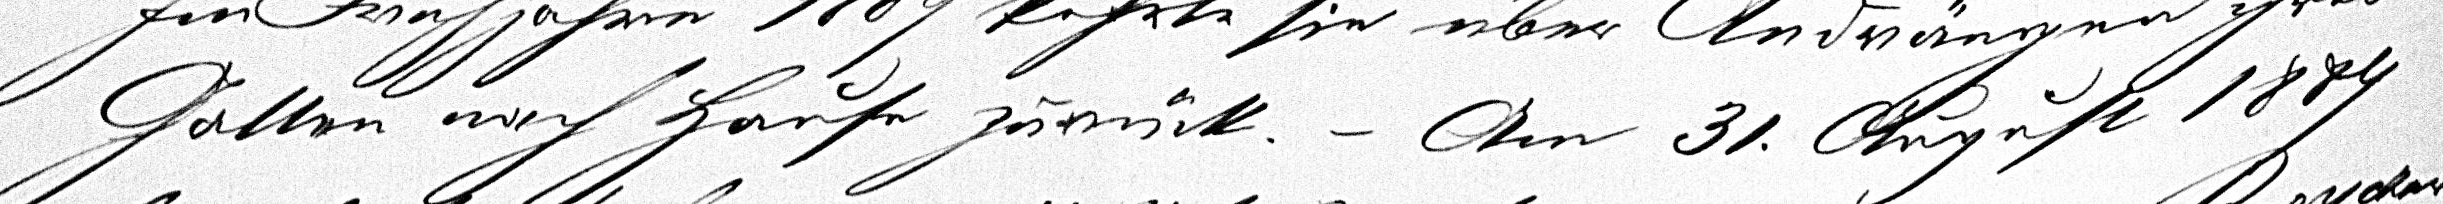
Gatten nach Hause zurück. - Am 31. August 1889
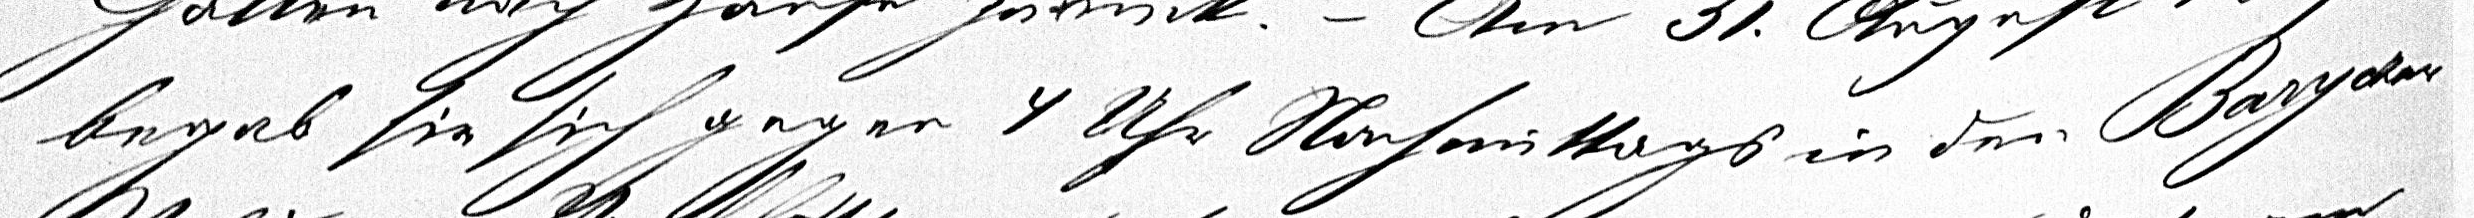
begab sie sich gegen 4 Uhr Nachmittags in den Baryczer
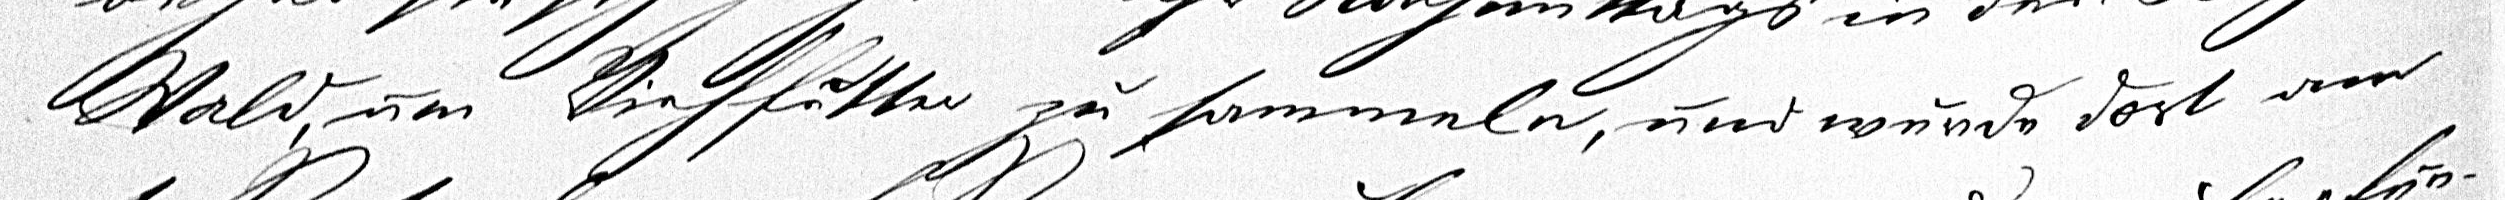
Wald, um Viehfutter zu sammeln, und wurde dort am
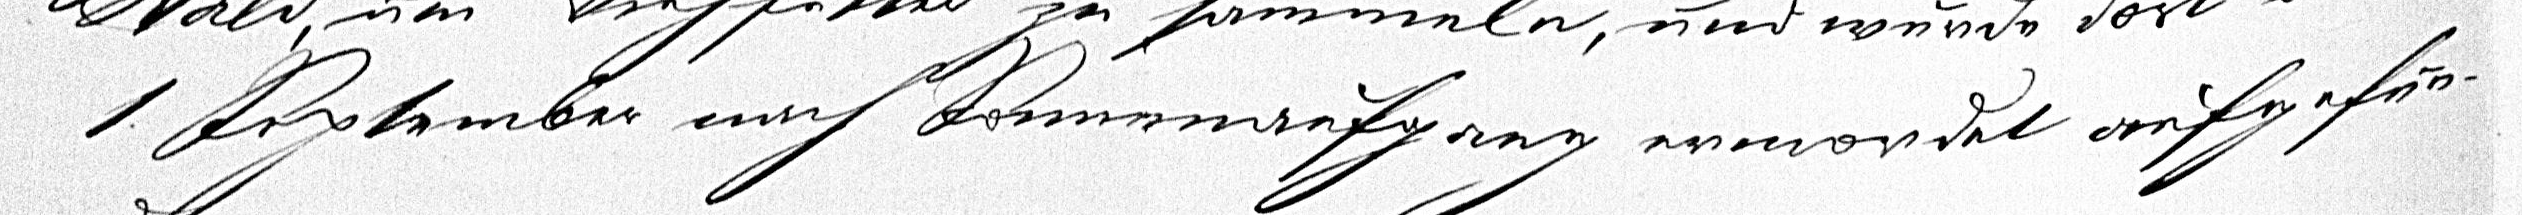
1. September nach Sonnenaufgang ermordet aufgefür¬
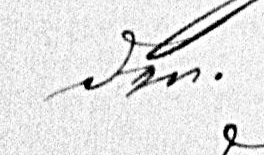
den.
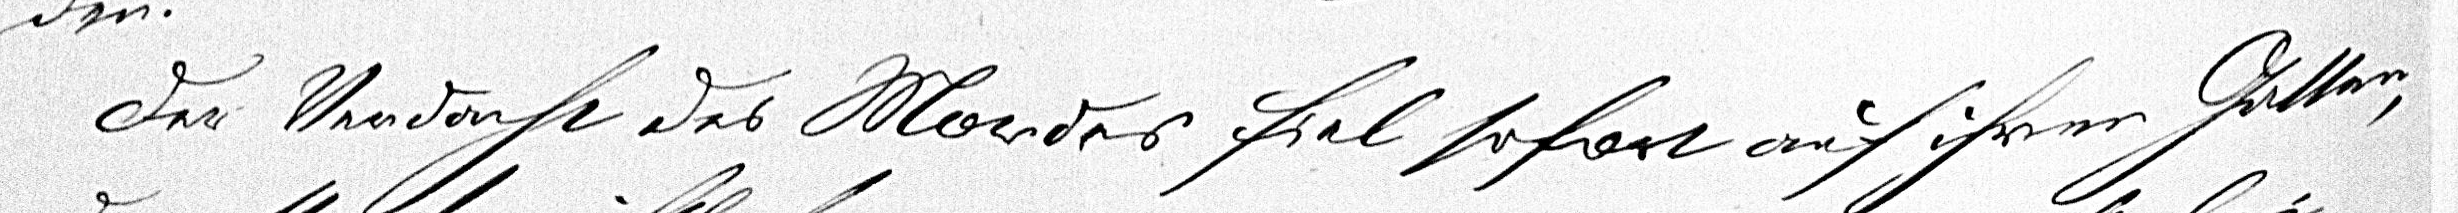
Der Verdacht des Mordes Fiel sofort auf ihrer Gatten,
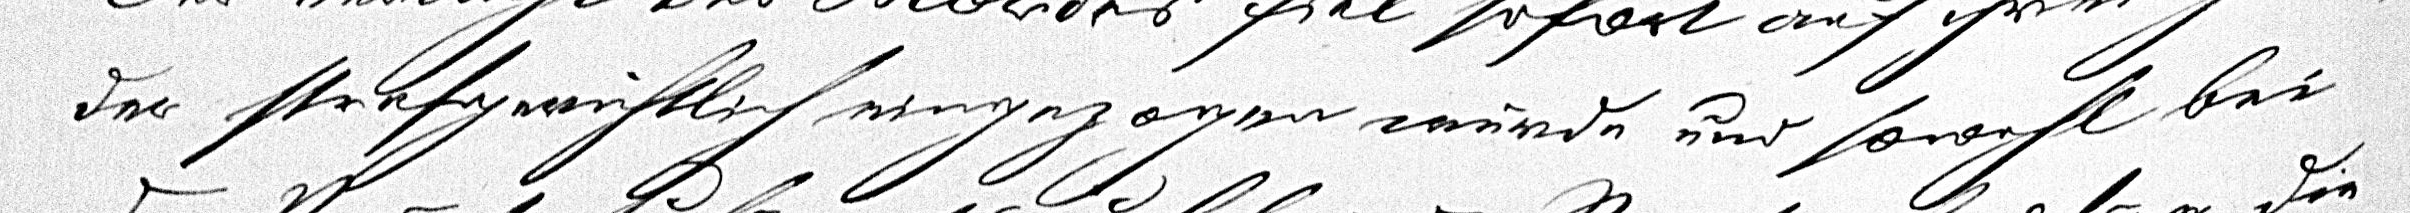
der strafgerichtlich eingezogen würde und sowohl bei
